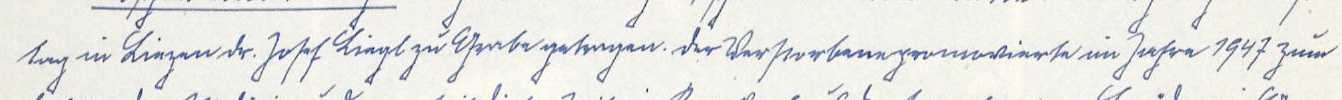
tag in Liezen Dr. Josef Liegl zu Grabe getragen. Der Verstorbene promovierte im Jahre 1947 zum
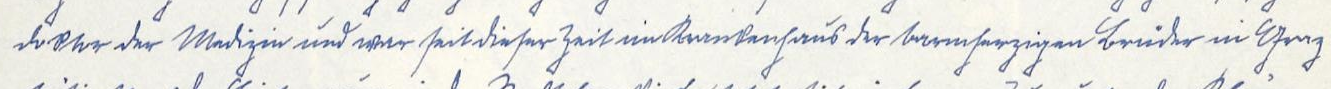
Doktor der Medizin und war seit dieser Zeit im Krankenhaus der barmherzigen Brüder in Graz
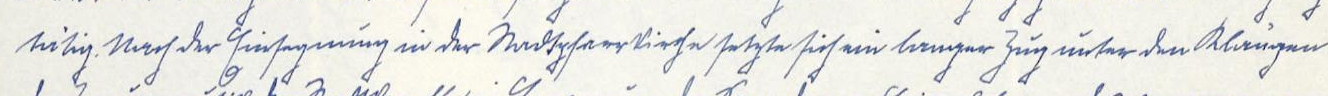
tätig. Nach der Einsegnung in der Stadtpfarrkirche setzte sich ein langer Zug unter den Klängen
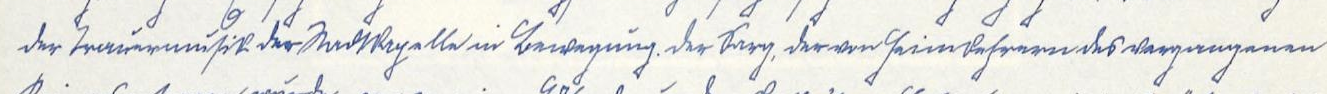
der Trauermusik der Stadtkapelle in Bewegung. Der Sarg, der von Heimkehrern des vergangenen
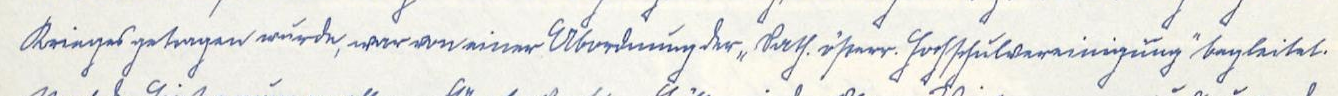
Krieges getragen wurde, war von einer Abordnung der kath österr. Hochschulvereinigung begleitet.
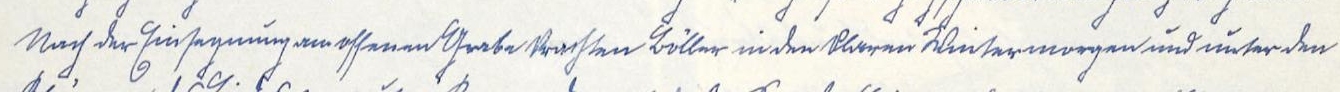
Nach der Einsegnung qm offenen Grabe krachten Böller in den klaren Wintermorgen und unter den
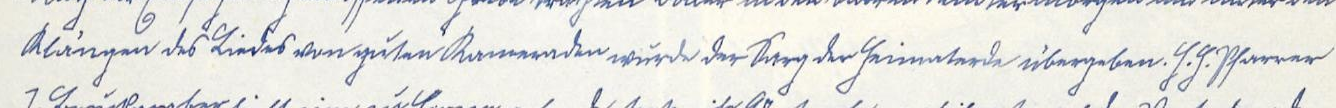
Klängen des Liedes vom guten Kameraden wurde der Sarg der Heimaterde übergehen. H. H. Pfarrer
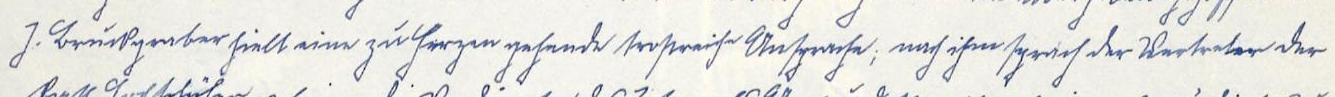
J. Bruckgraber hielt eine zu Herzen gehende trostreiche Ansprache; nach ihm sprach der Vertreter der
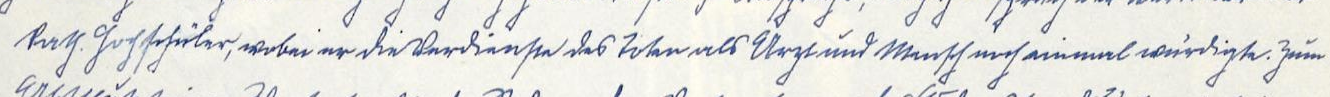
kath. Hofschüler, wobei er die Verdienste des Toten als Arzt und Mensch noch einmal würdigte. Zum
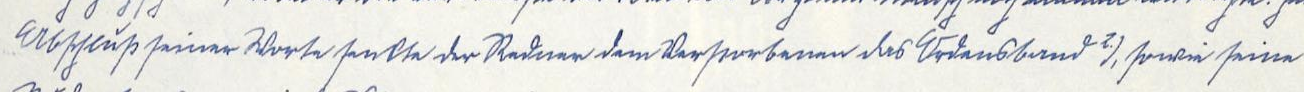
Abschluß seiner Worte senkte der Redner dem Verstorbenen das Ordensband 2), sowie seine
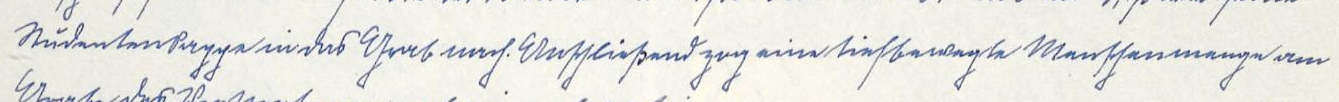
Studentenkappe in das Grab nach. Anschließend zog eine tiefbewegte Menschnmenge am
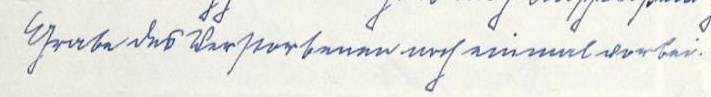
Grabe des Verstorbenen noch einmal vorbei.-
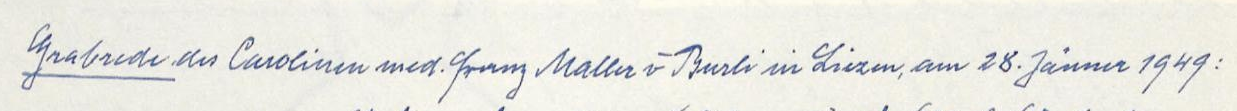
Grabrede des Carolinen med. Franz Maller v/o Burli in Liezen, am 28. Jänner 1949:
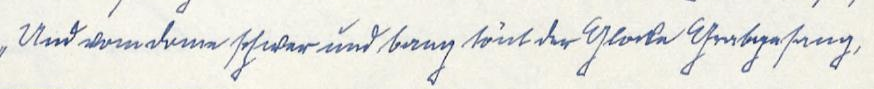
"Und vom Dome schwer und bang tönt der Glocke Grabgesang,
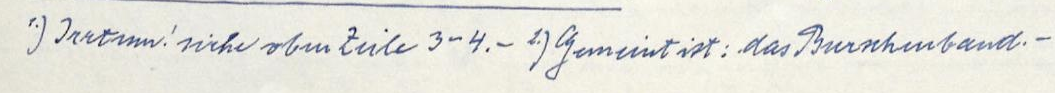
1) Irrtum! siehe oben Zeile 3 -4.- 2) Gemeint ist: das Burschenband.
